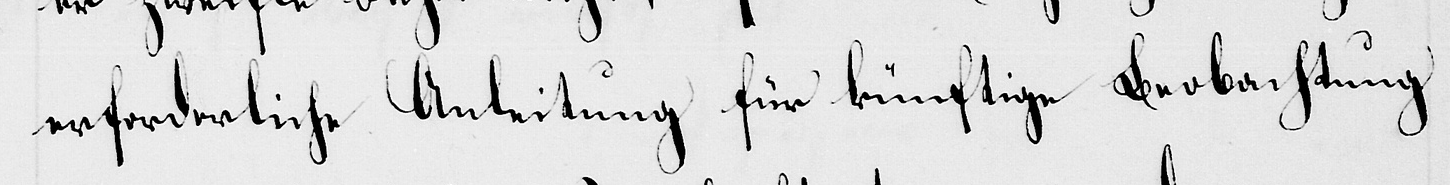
erforderliche Anleitung für künftige Beobachtung
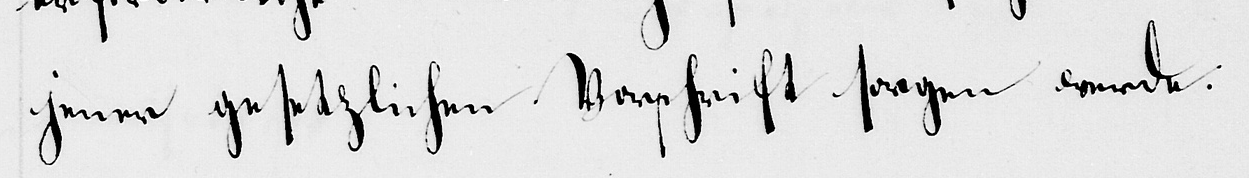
jener gesetzlichen Vorschrift sorgen werde.
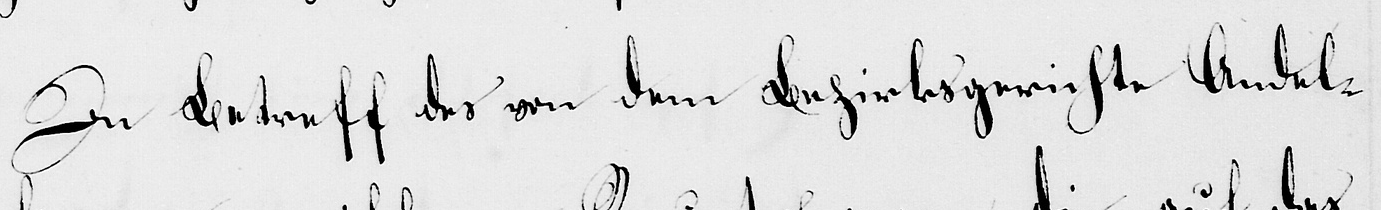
In Betreff des von dem Bezirksgerichte Andel¬
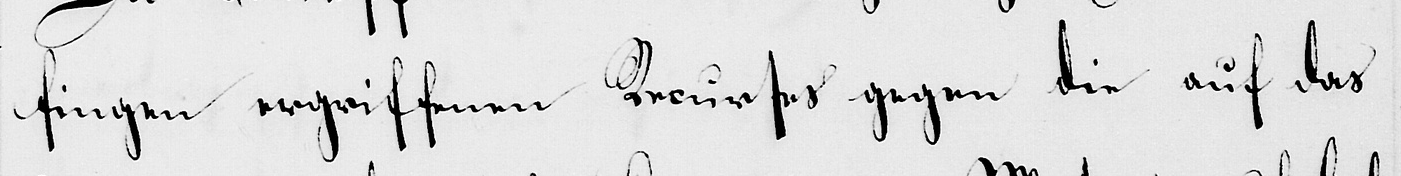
fingen ergriffenen Recurses gegen die auf das
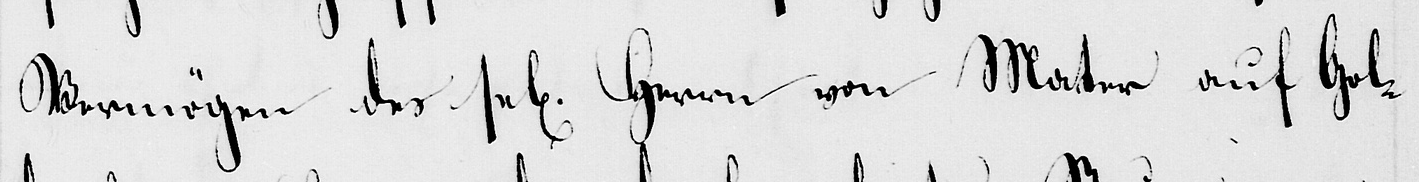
Vermögen des sel[igen] Herrn von Mater auf Gol¬
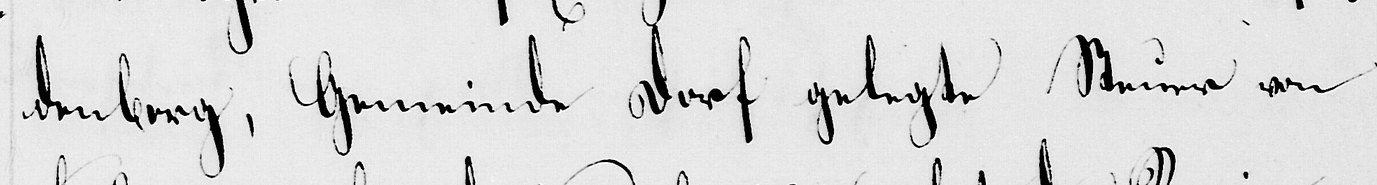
denberg, Gemeinde Dorf gelegte Steuer von
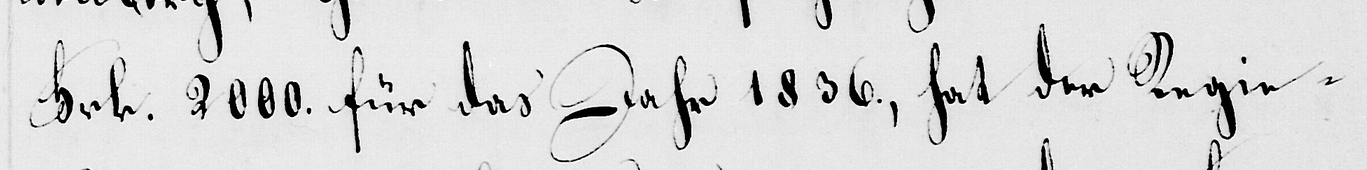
Frk. 2000. für das Jahr 1836., hat der Regie¬
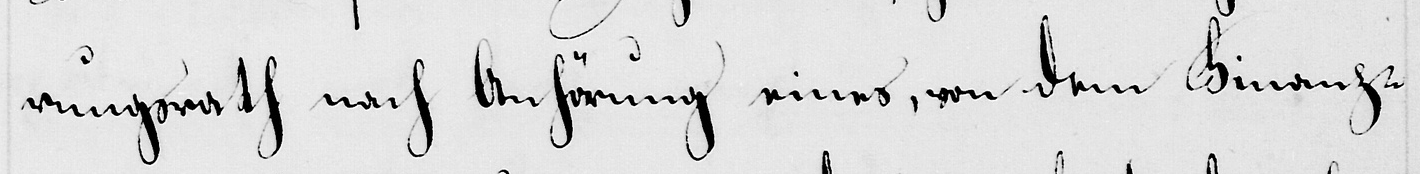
rungsrath nach Anhörung eines, von dem Finanz¬
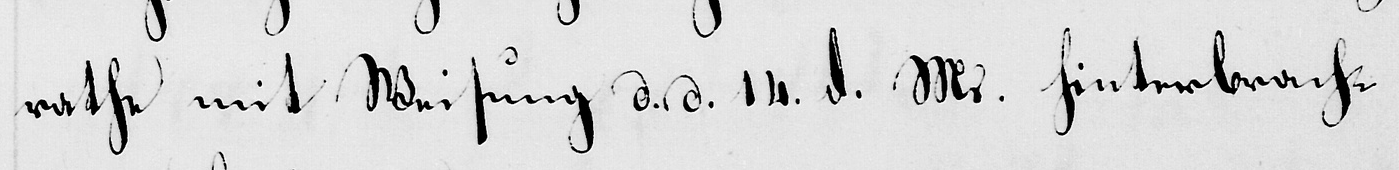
rathe mit Weisung d. d. 14. d. Ms. hinterbrach¬
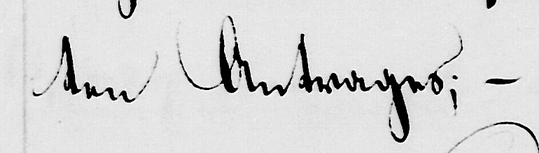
ten Antrages;
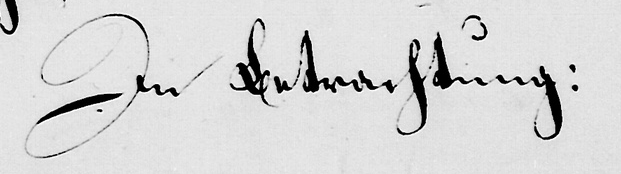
In Betrachtung:
